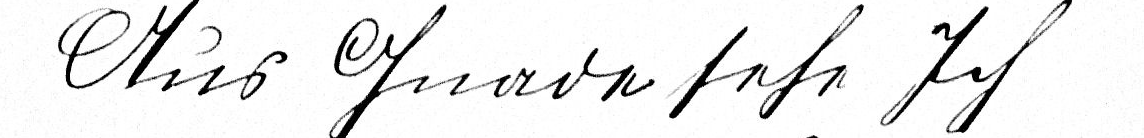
Aus Gnade sehe Ich
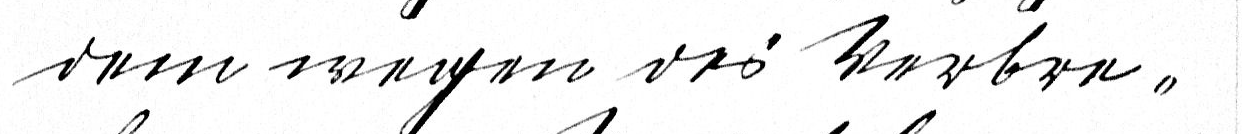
dem wegen des Verbre¬
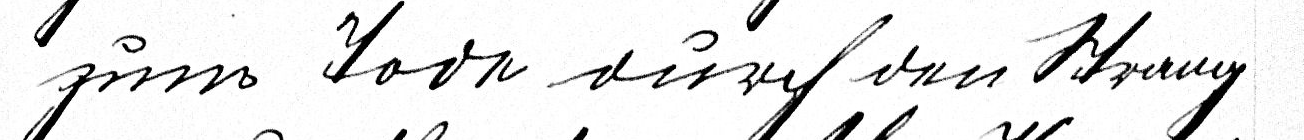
zum Tode durch den Strang
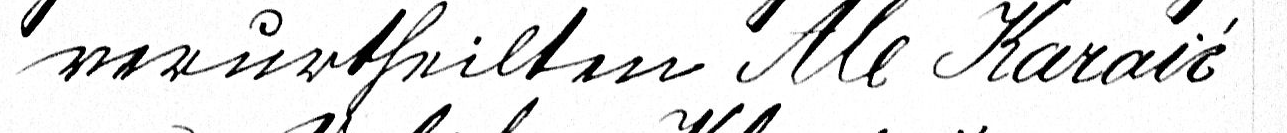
verurtheilten Ale Karaić
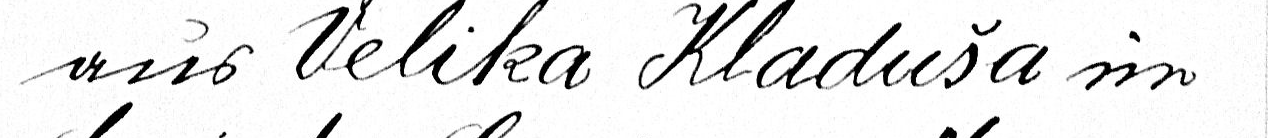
aus Velika Kladusa im
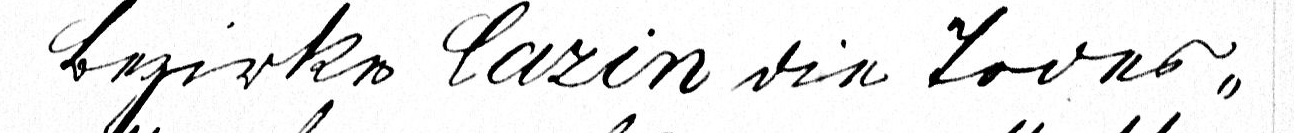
Bezirke Cazin die Todes¬
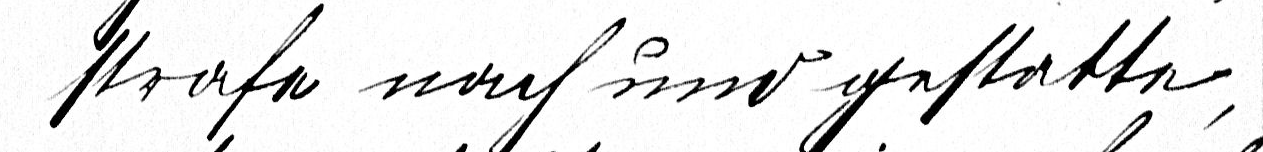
strafe nach und gestatte
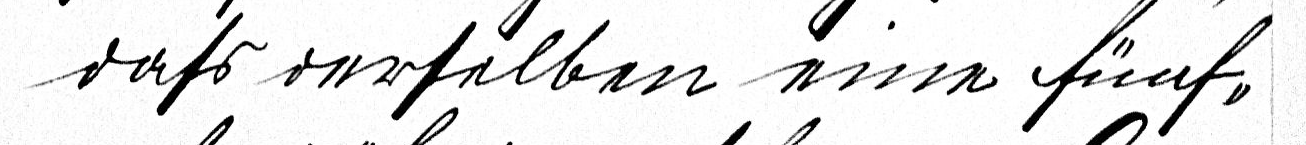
dass derselben eine fünf¬
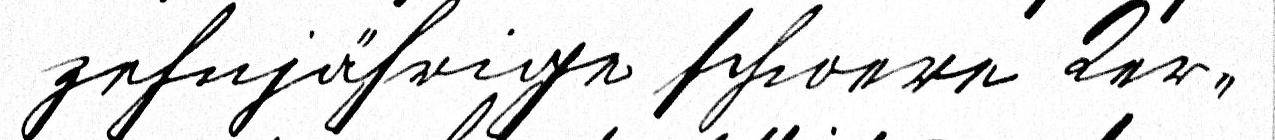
zehnjährige schwere Ker¬
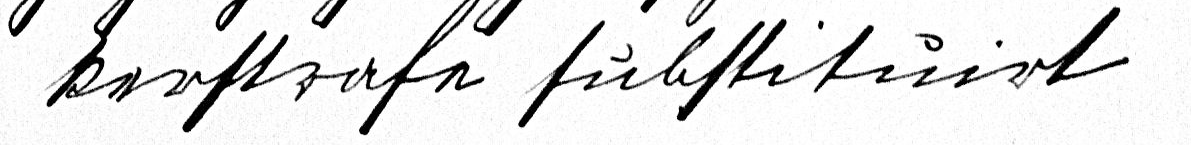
kerstrafe substituirt
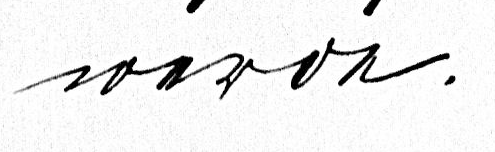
werde.
